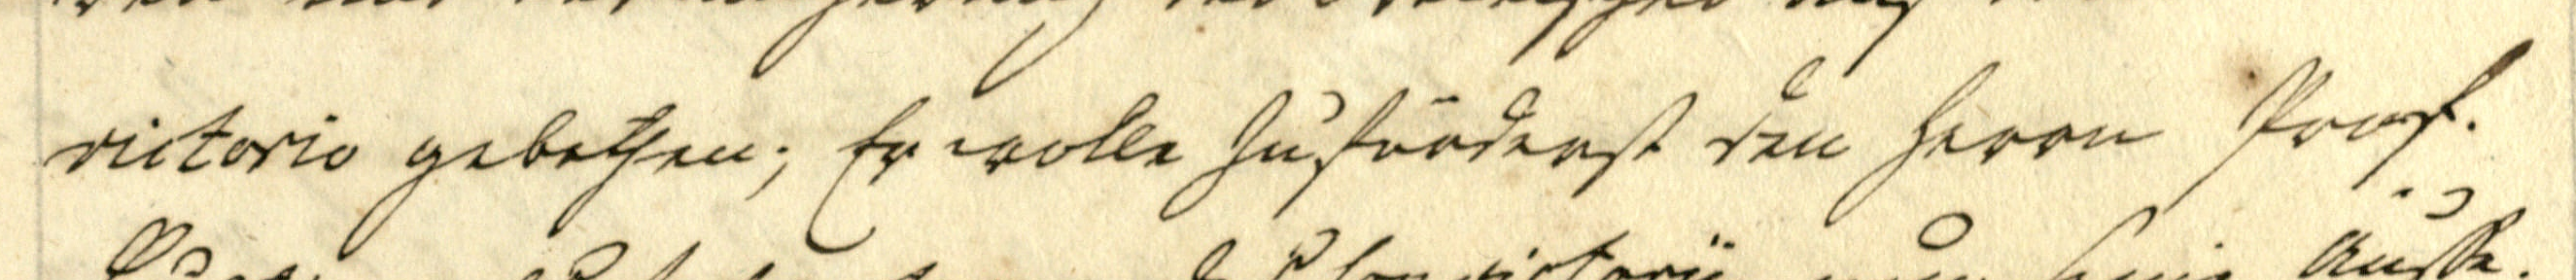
victorio gebethen; Er wolle zuförderst den Herrn Prof.
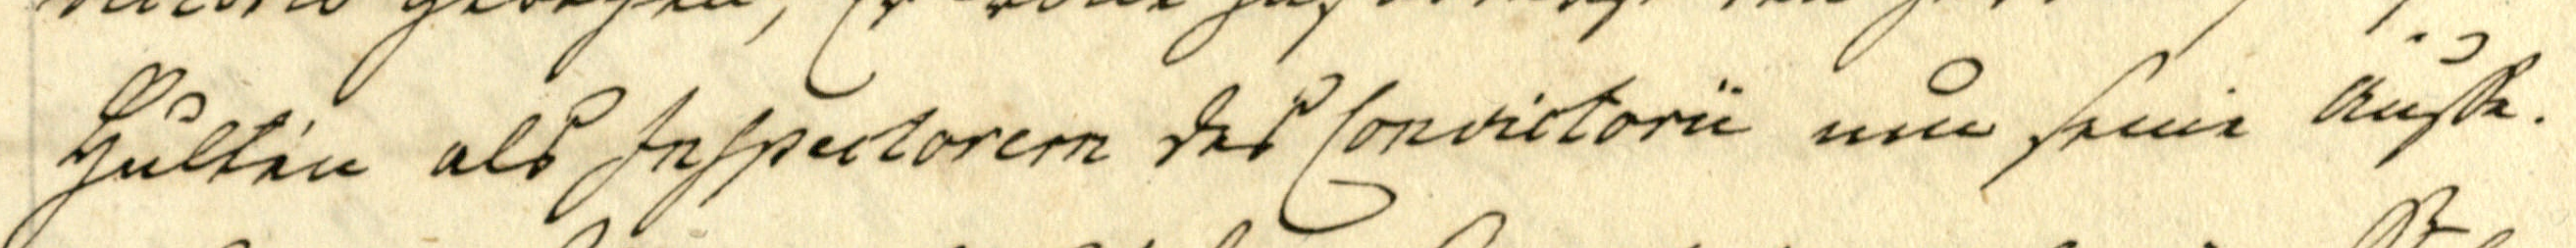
Hultén als Inspectorem des Convictorio um seine Äusse¬
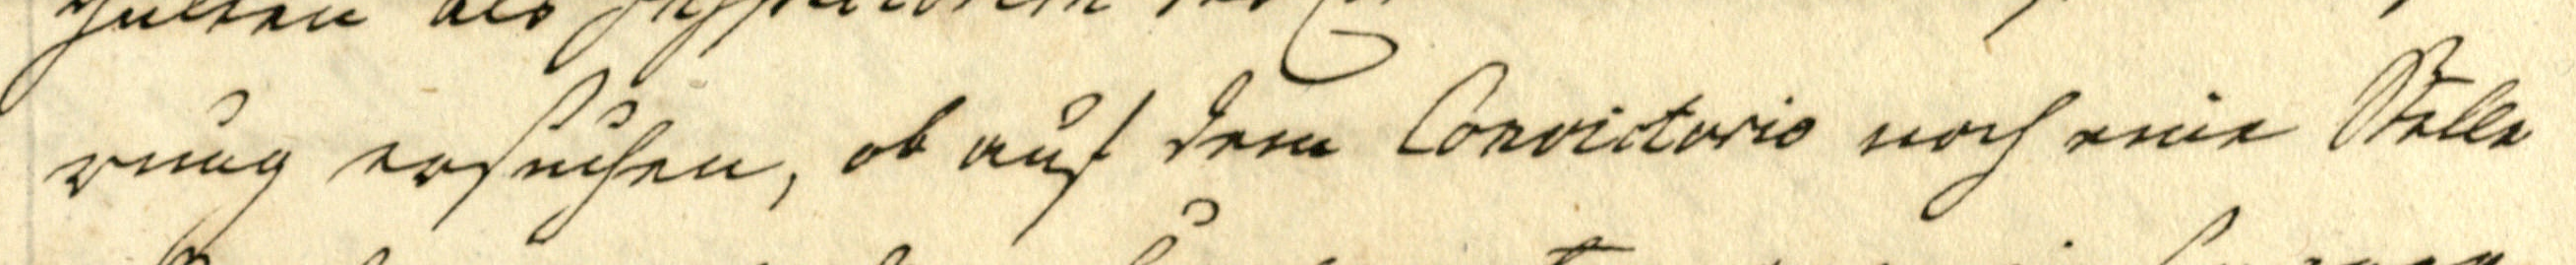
rung ersuchen, ob auf dem Convictorio noch eine Stelle
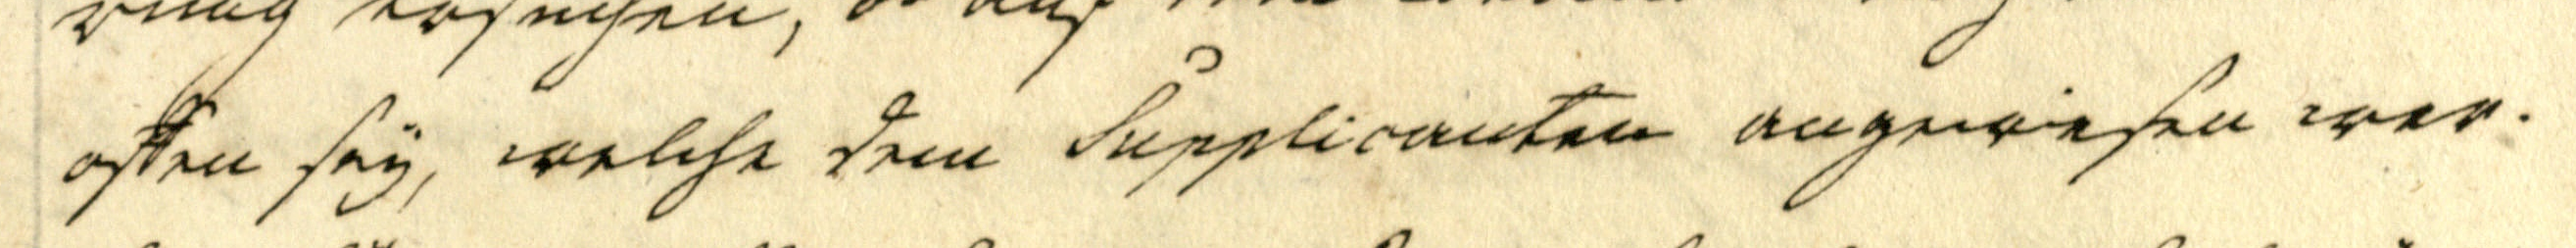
offen seÿ, welche dem Supplicanten angewiesen wer¬
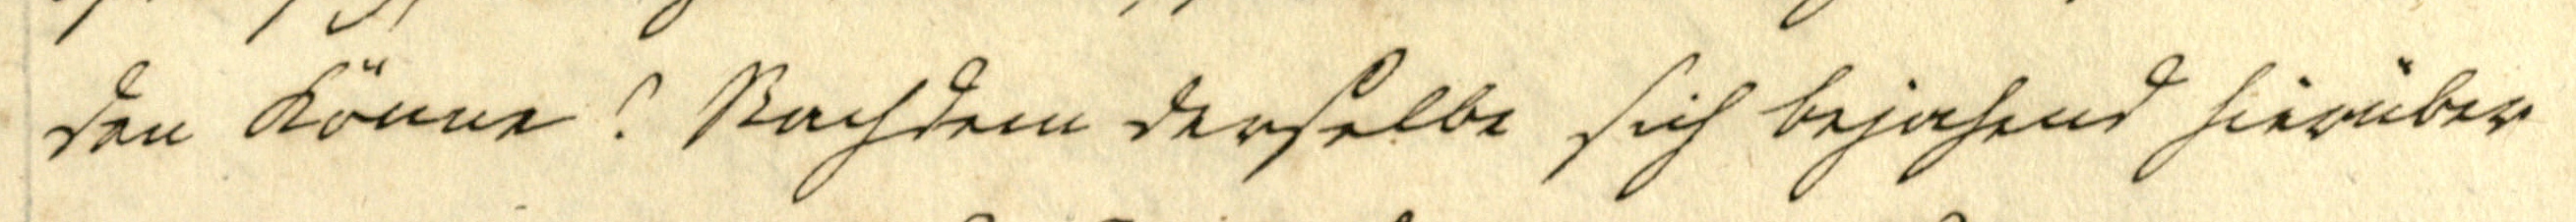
den könne? Nachdem derselbe sich bejahend hierüber
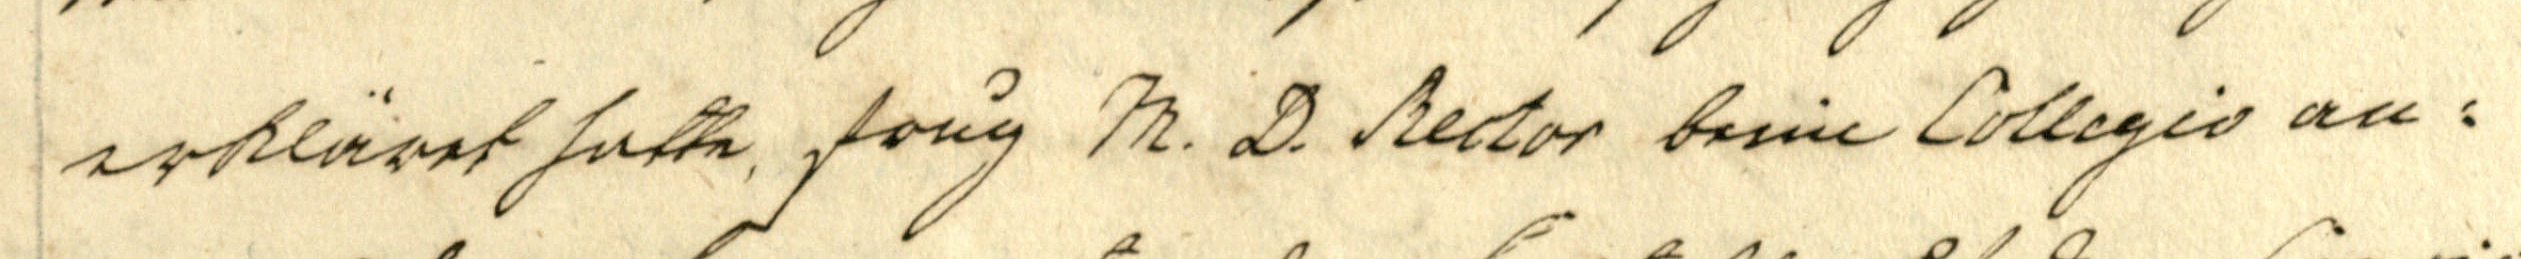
erkläret hätte, frug M. D. Rector beim Collegio an:
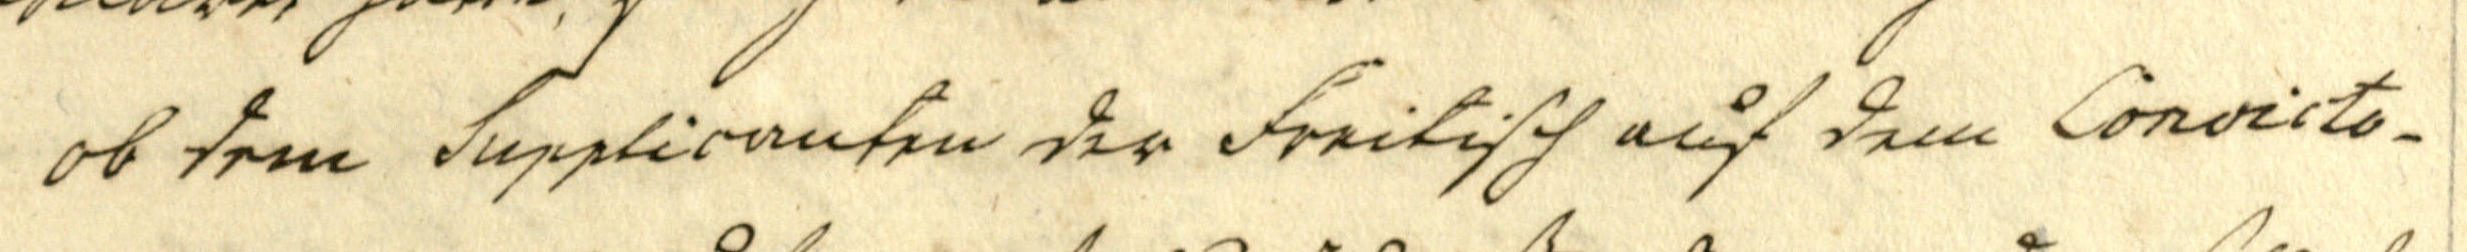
ob dem Supplicanten der Freitisch auf dem Convicto¬
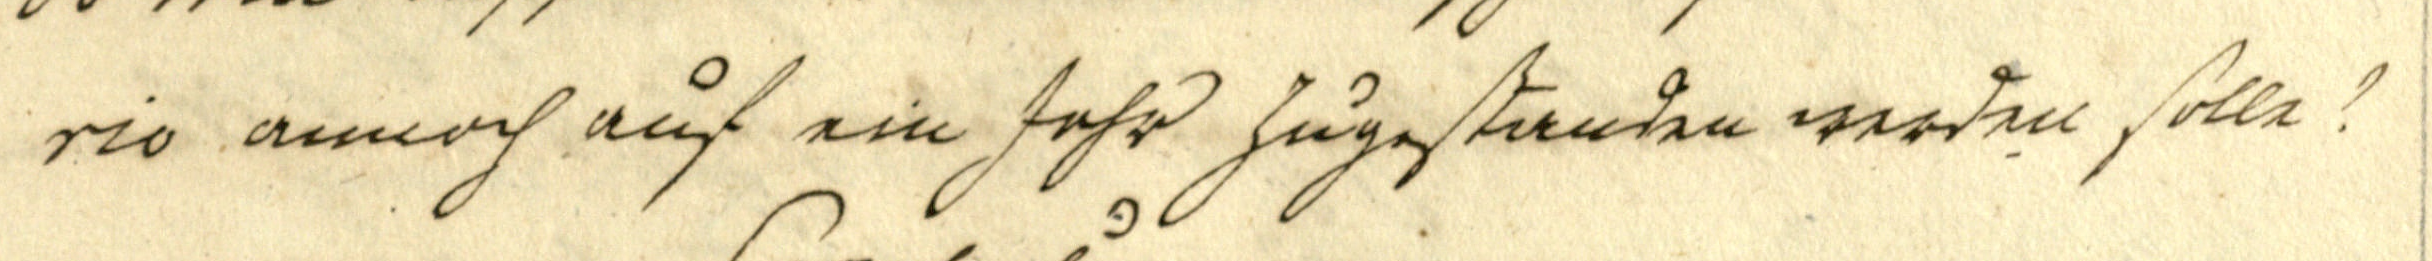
rio annoch auf ein Jahr zugestanden werden solle?
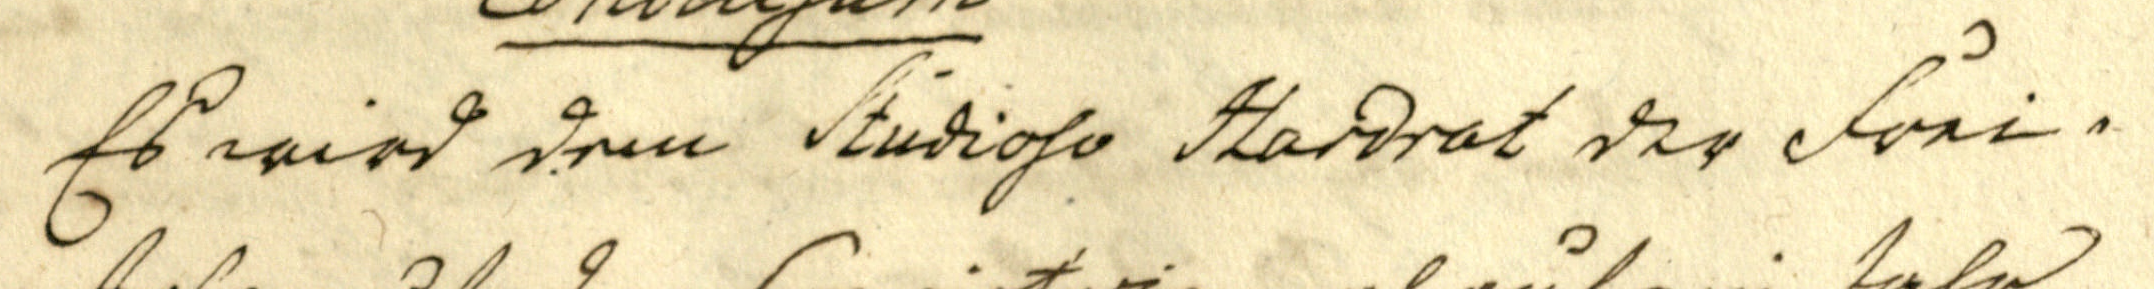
Es wird dem Studioso Hardrat der Frei¬
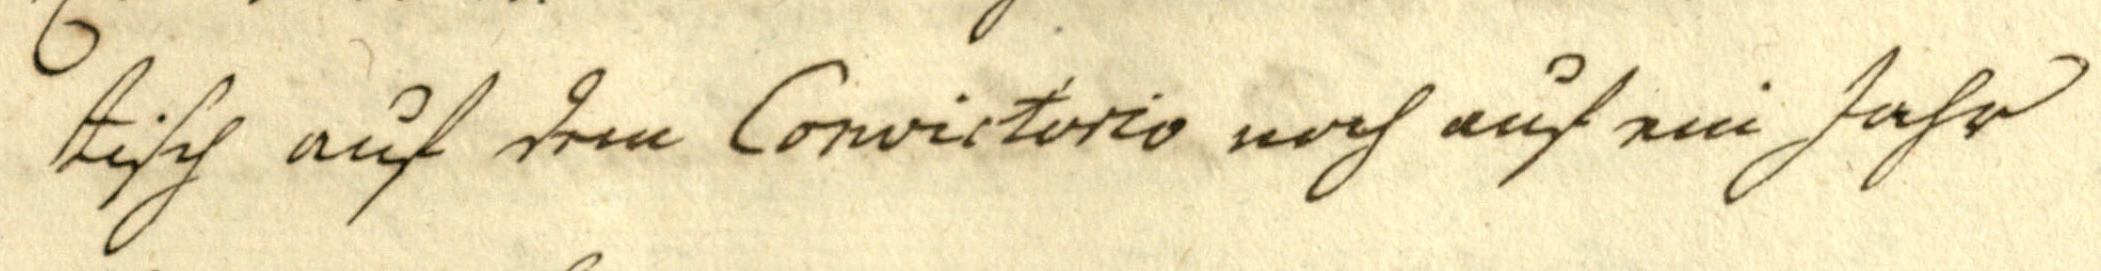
tisch auf dem Convictorio noch auf ein Jahr
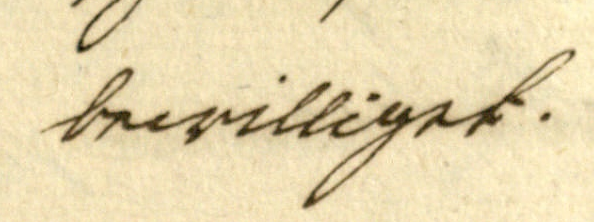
bewilliget.
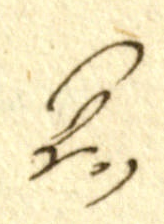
2.,
